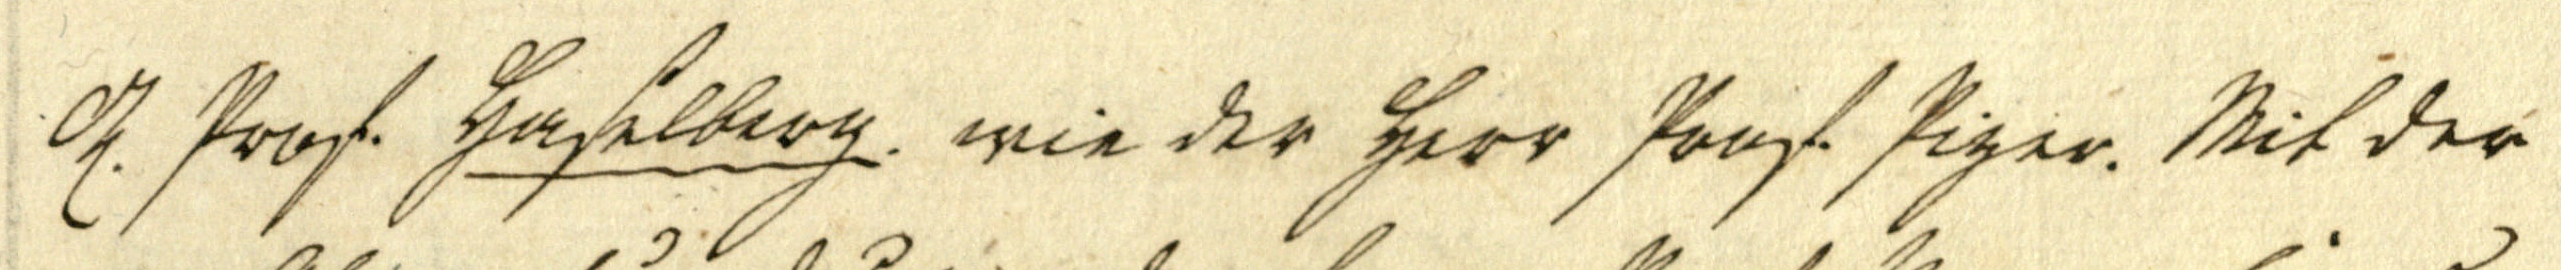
dh. Prof. Haselberg. wie der Herr Prof. Piper. Mit der
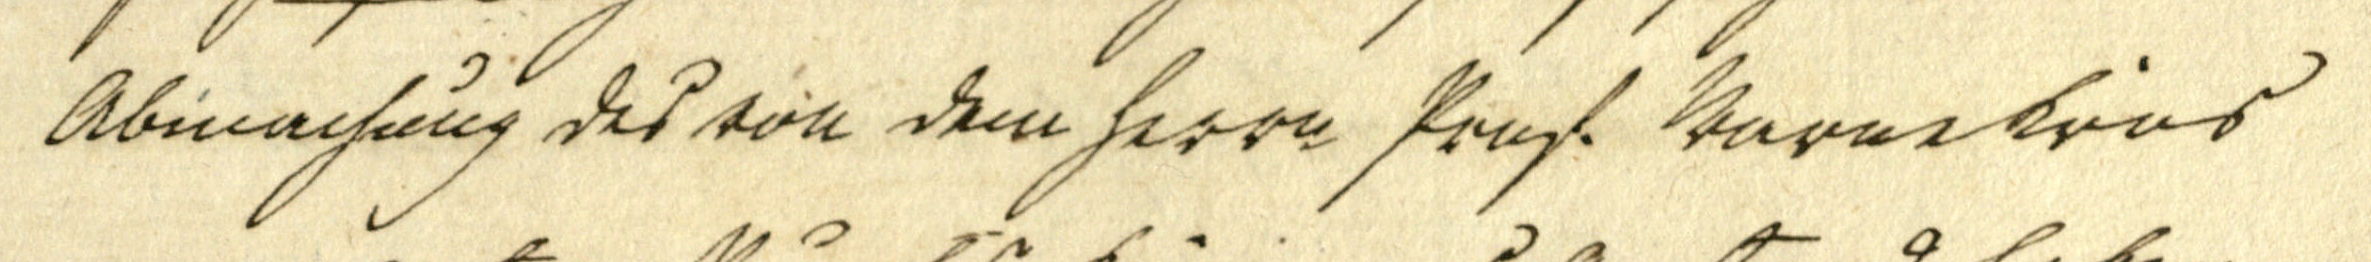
Abmachung des von dem Herrn Prof. Warnekros
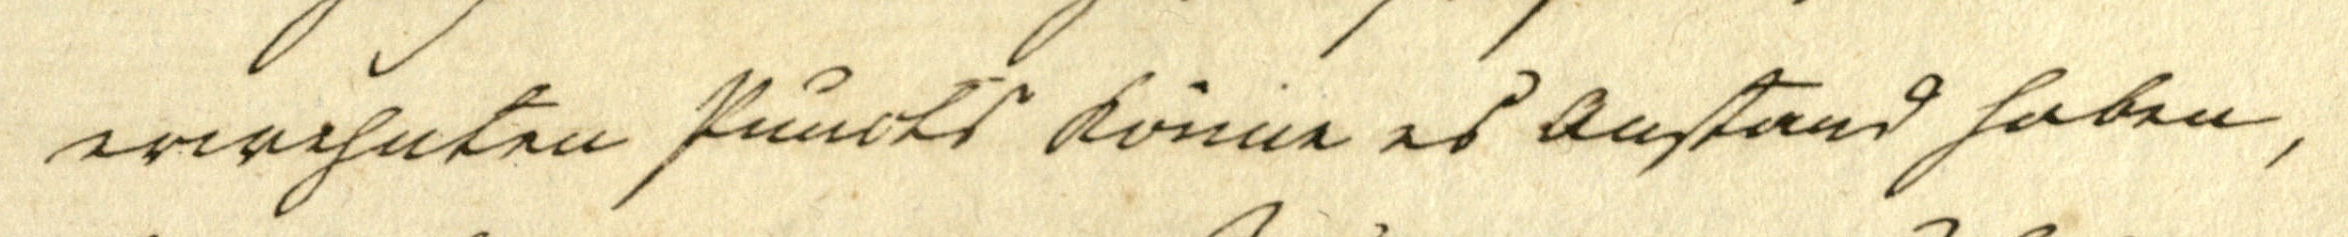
erwehnten Puncts könne es Anstand haben,
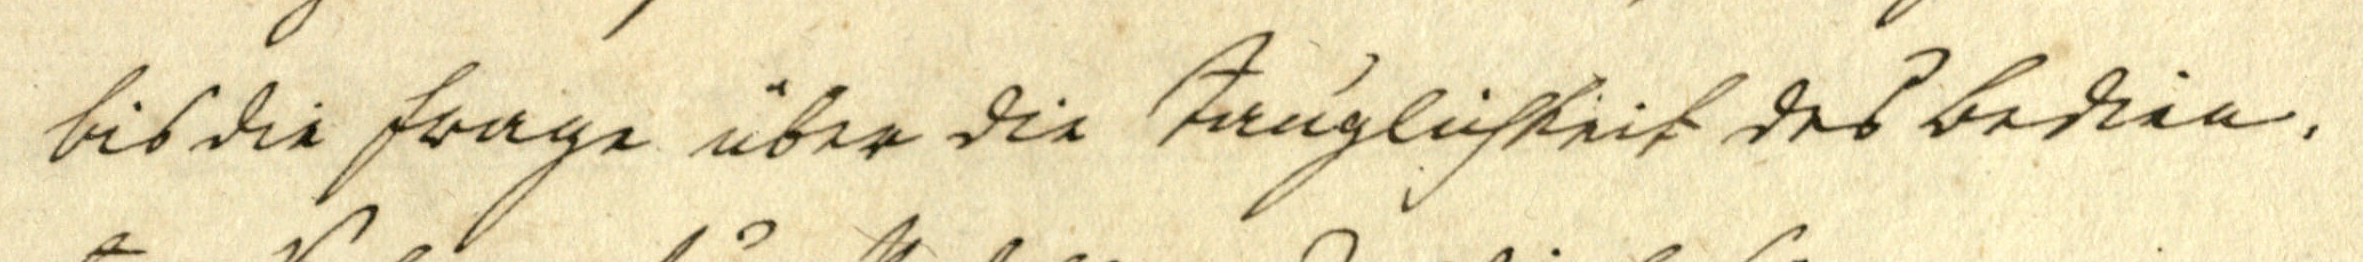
bis die Frage über die Tauglichteit des Bedien¬
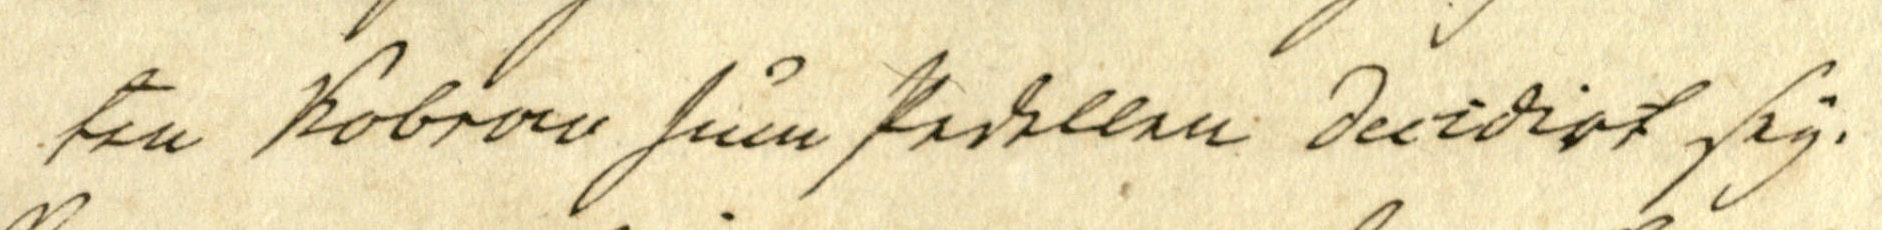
ten Kobrow zum Pedellen decidirt seÿ.
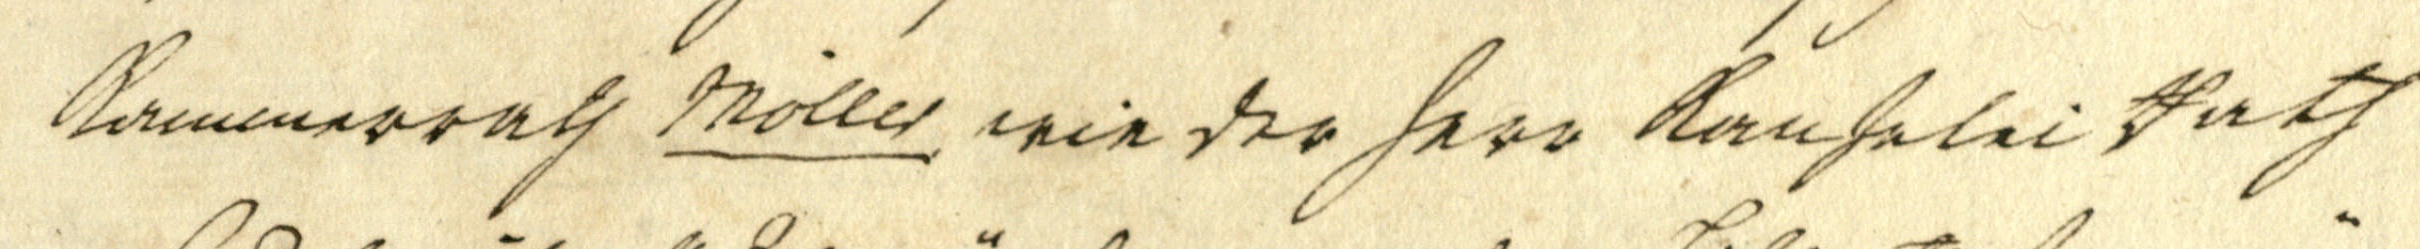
Kammerrath Möller, wie der Herr Kanzelei Rath
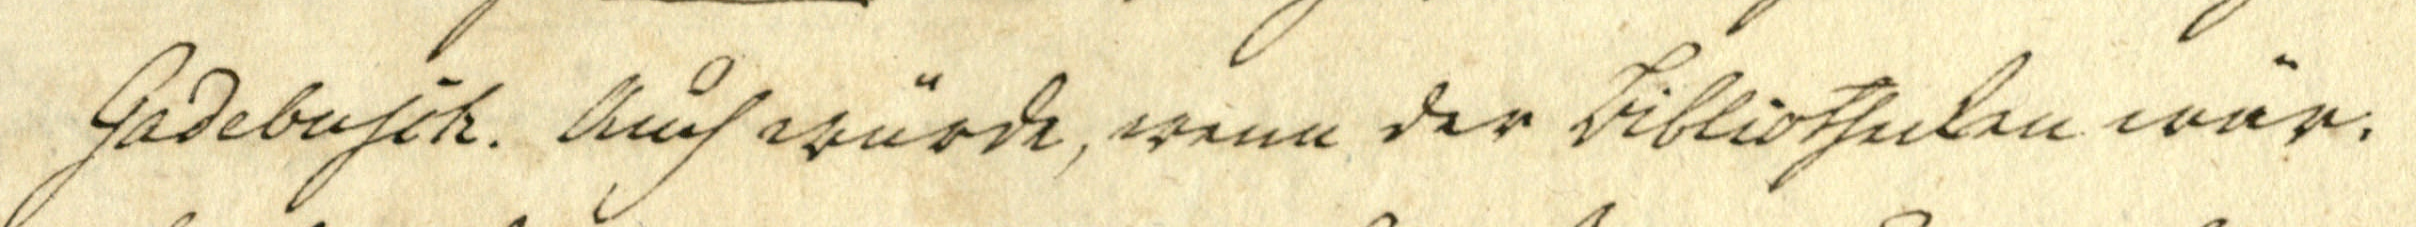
Gadebusch. Auch würde, wenn der Bibliotheken wär¬
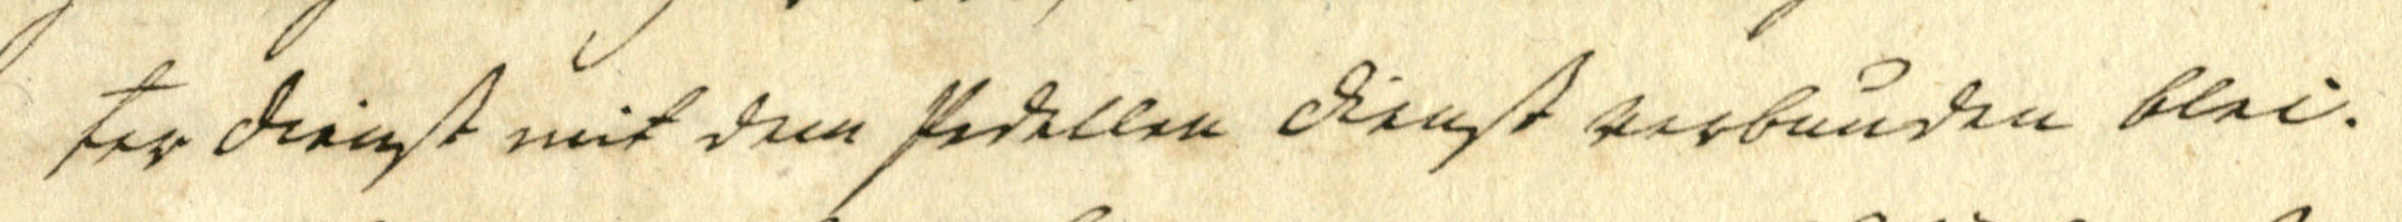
ter Dienst mit dem Pedellen Dienst verbunden blei¬
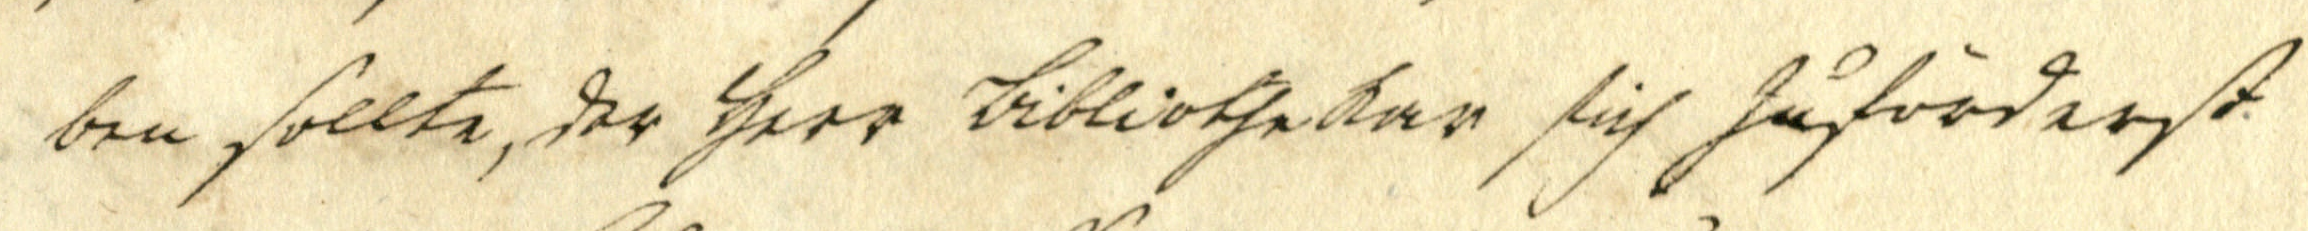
ben sollte, der Herr Bibliothekar sich zuförderst
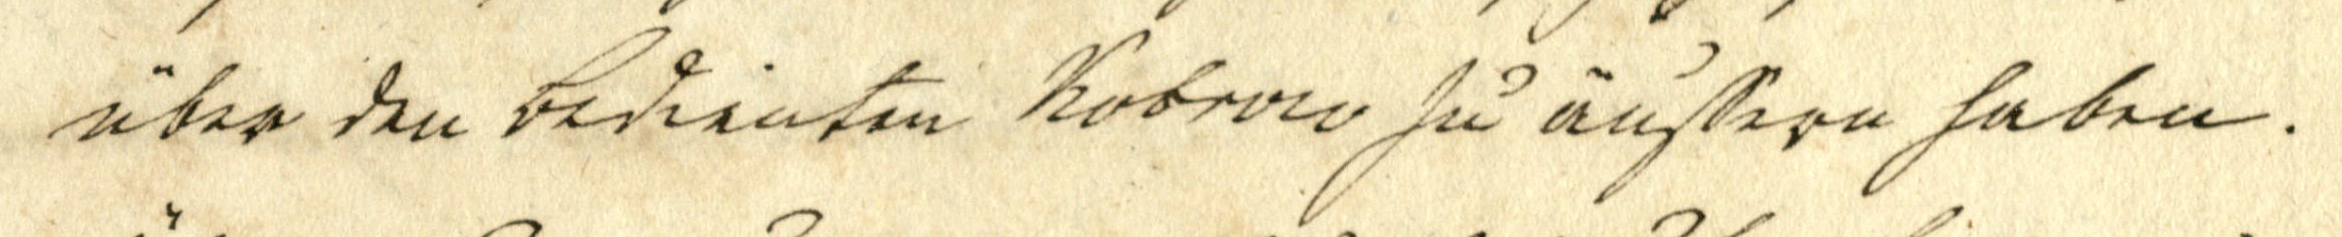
über den Bedienten Kobrow zu äussern haben.
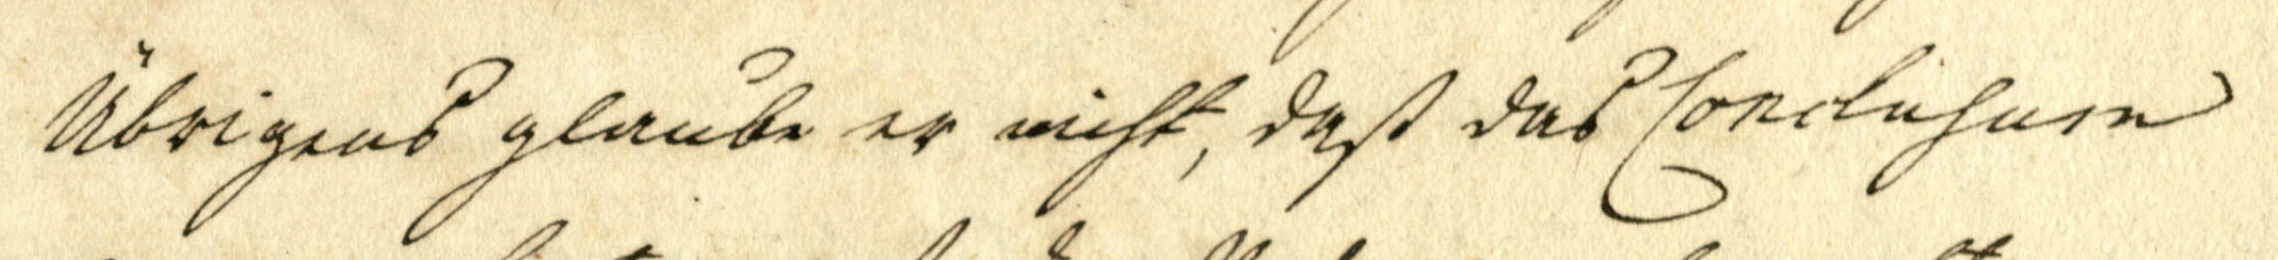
Übrigens glaube er nicht, daß das Conclusum
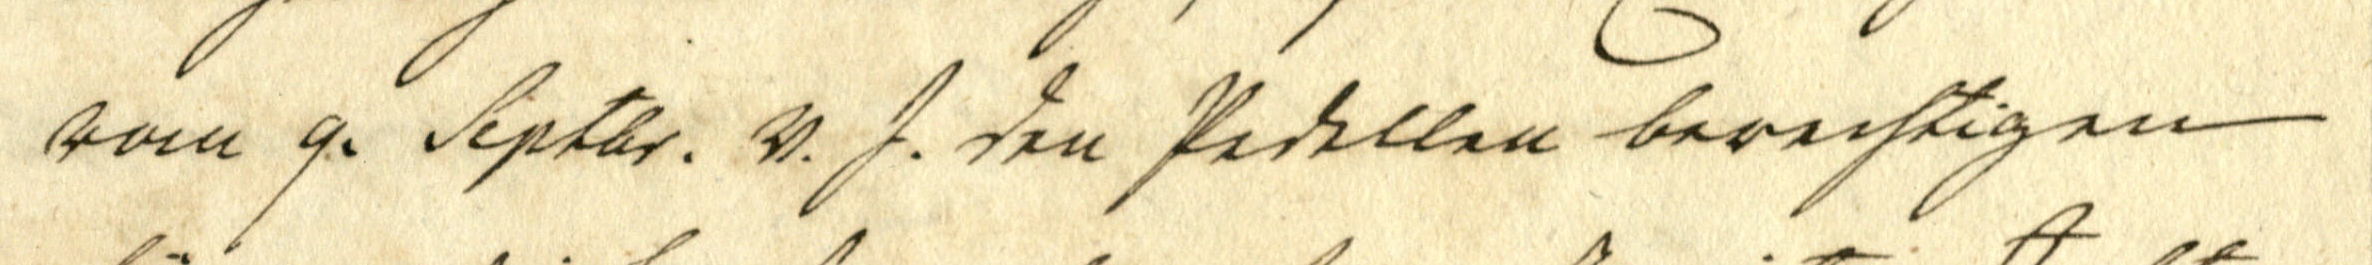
vom 9. Septbr. v. J. den Pedellen berechtigen
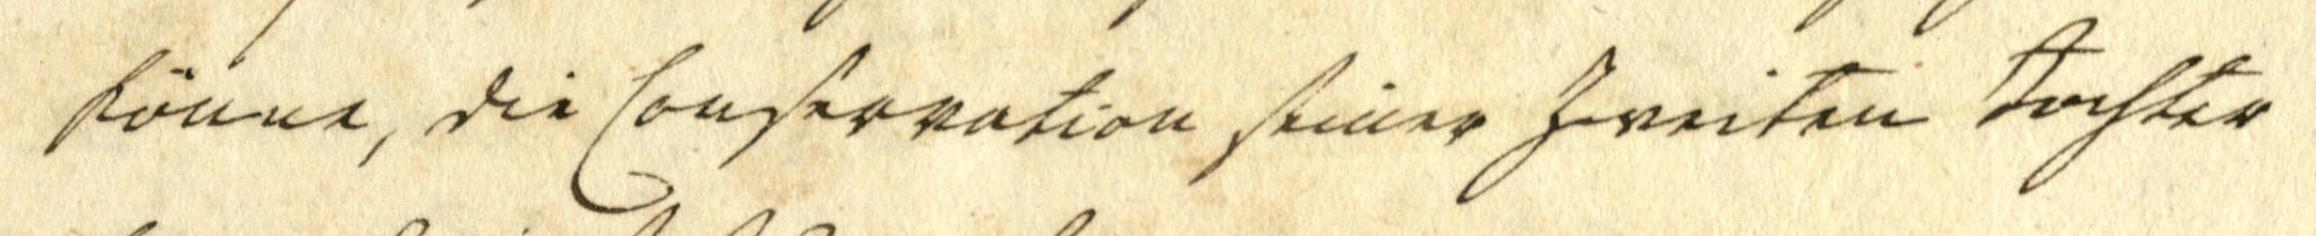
könne, die Conservation seiner zweiten Tochter
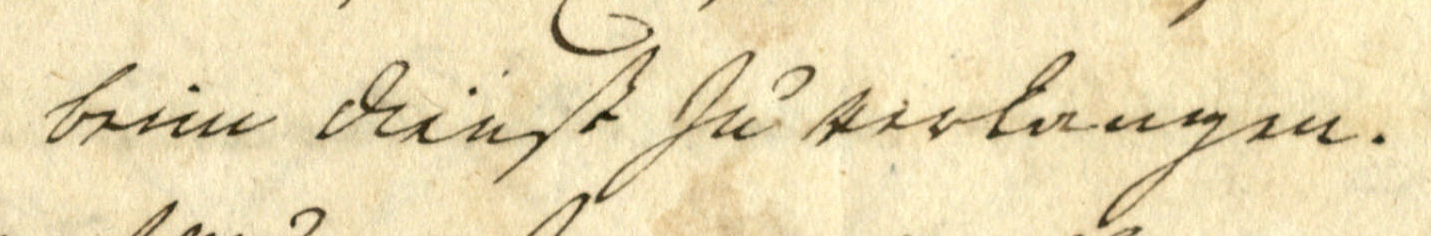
beim Dienst zu verlangen.
